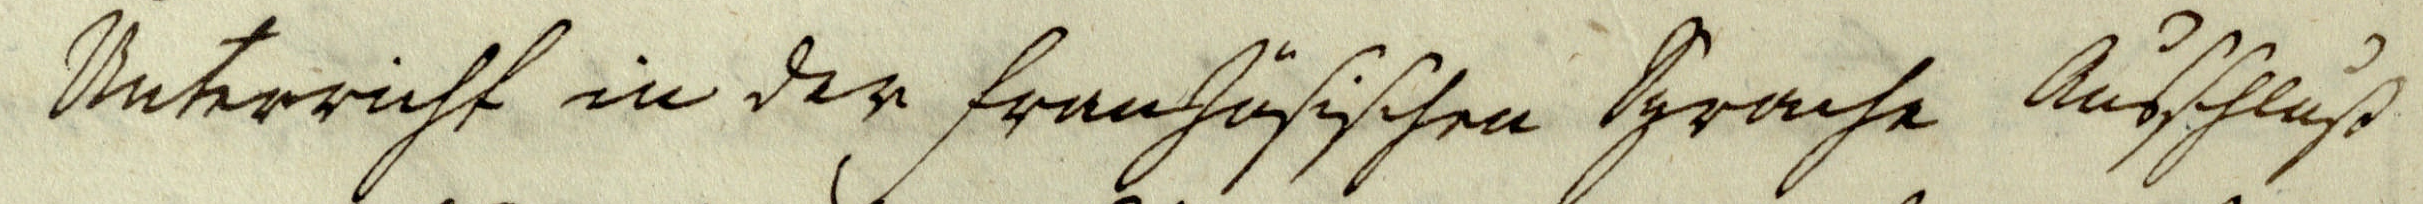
Unterricht in der Französischen Sprache Ausschluß
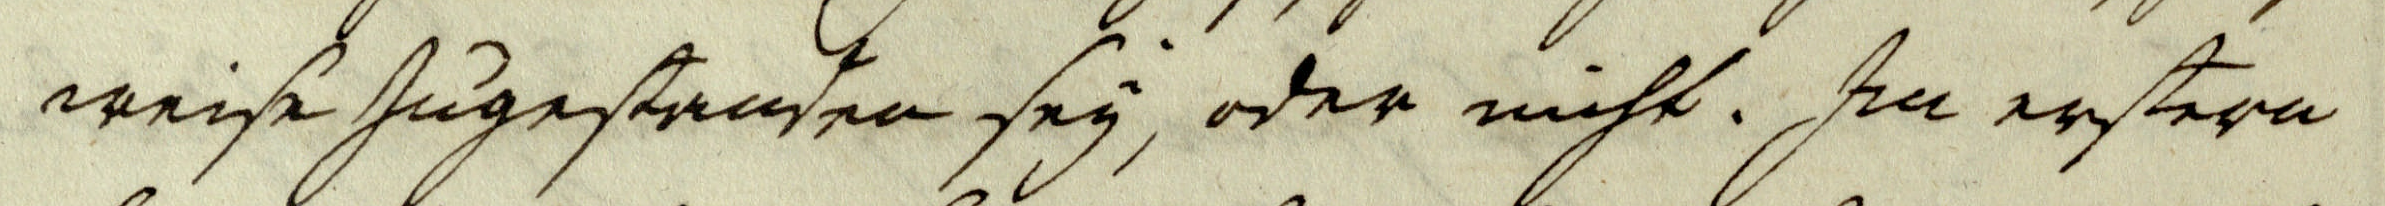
weise zugestanden seÿ, oder nicht. Im erstern
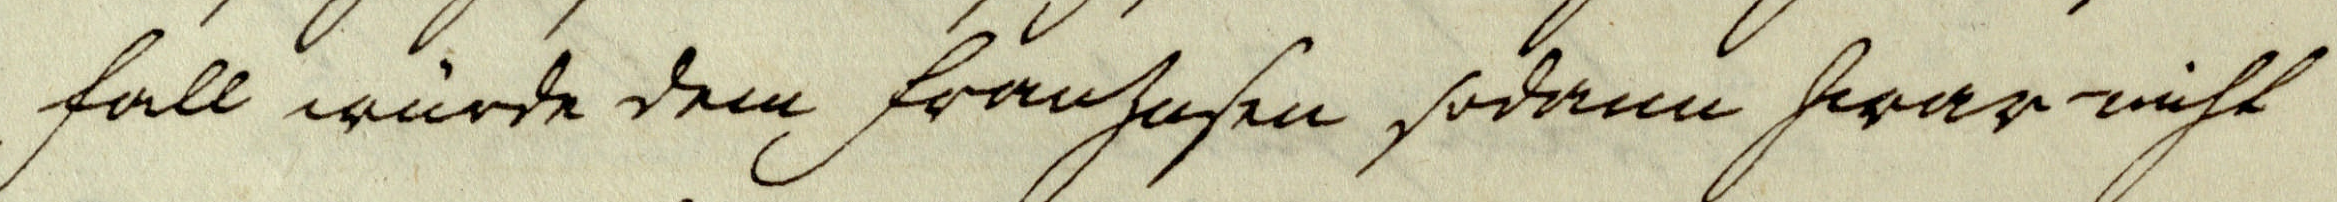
Fall würde dem Franzosen sodann zwar nicht
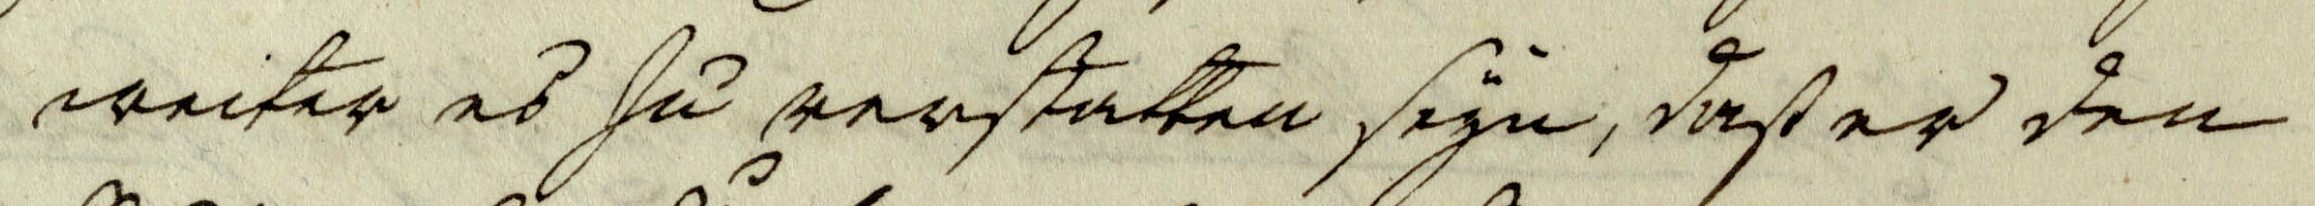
weiter es zu verstatten seÿn, daß er den
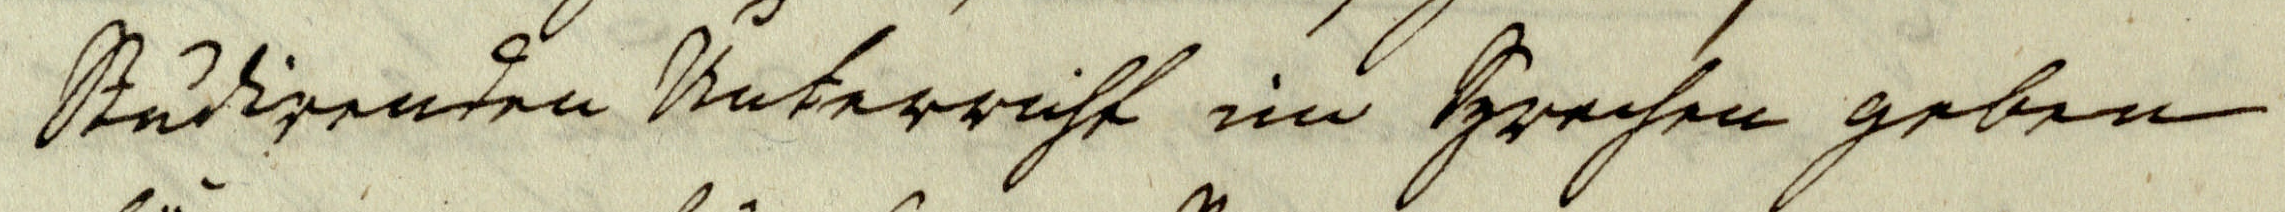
Studirenden Unterricht im Sprechen geben
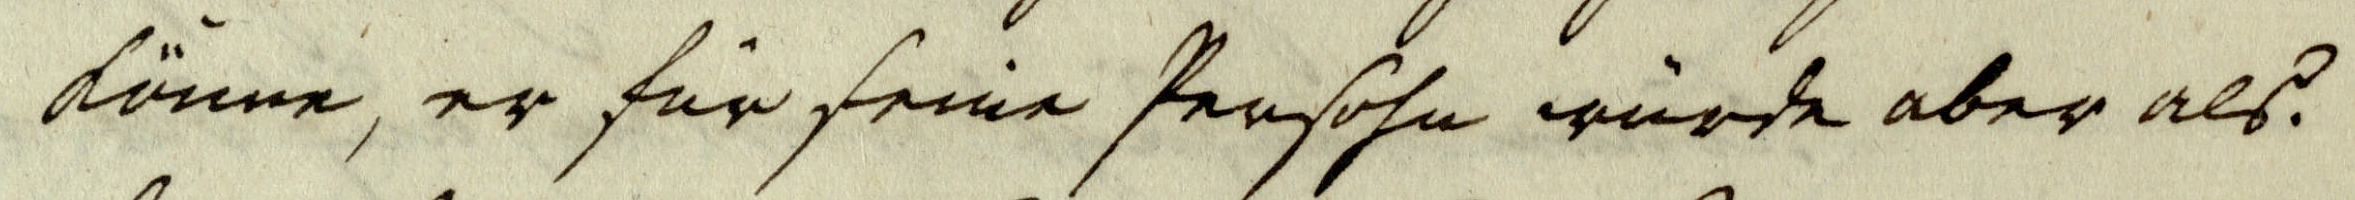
könne, er für seine Persohn würde aber als¬
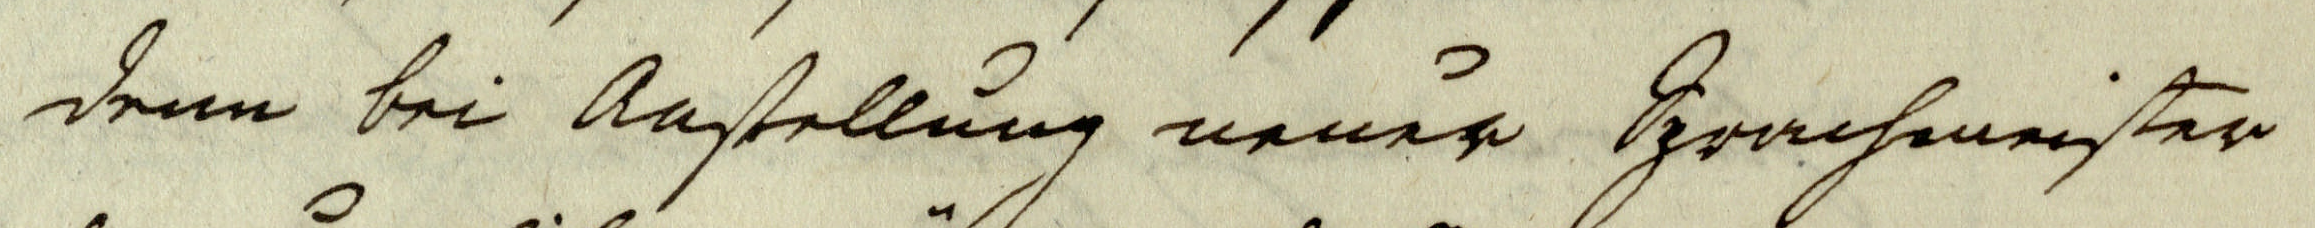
dann bei Anstellung neuer Sprachmeister
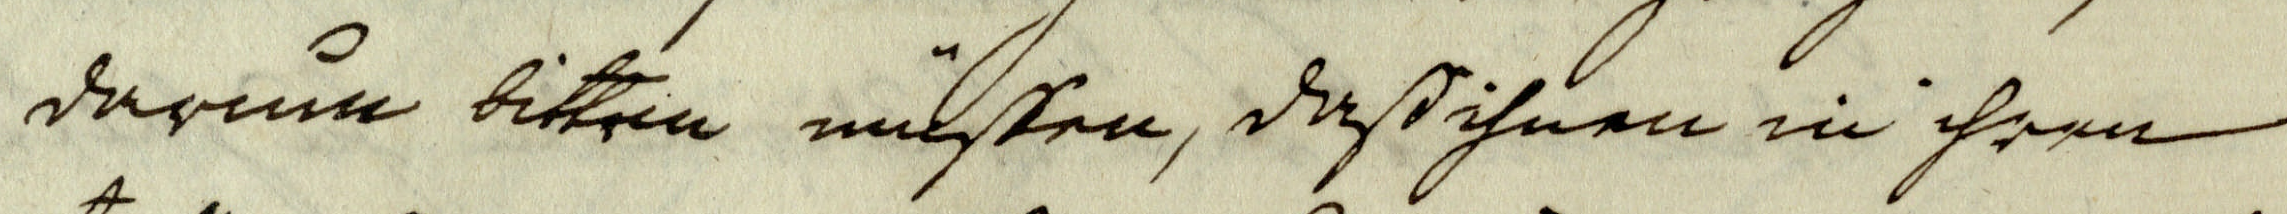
darum bitten müssen, daß ihnen in ihren
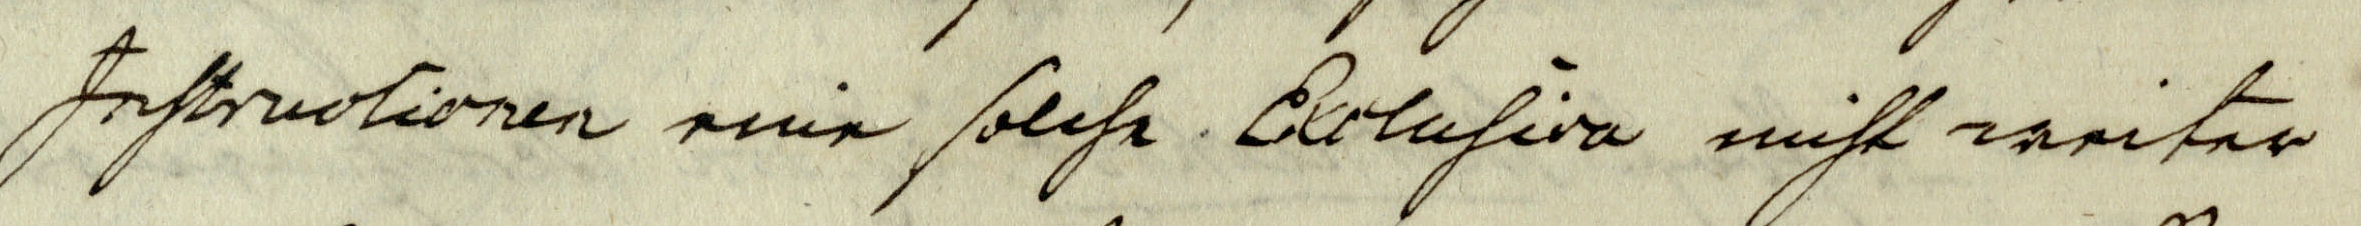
Instructionen eine solche Exclusiva nicht weiter
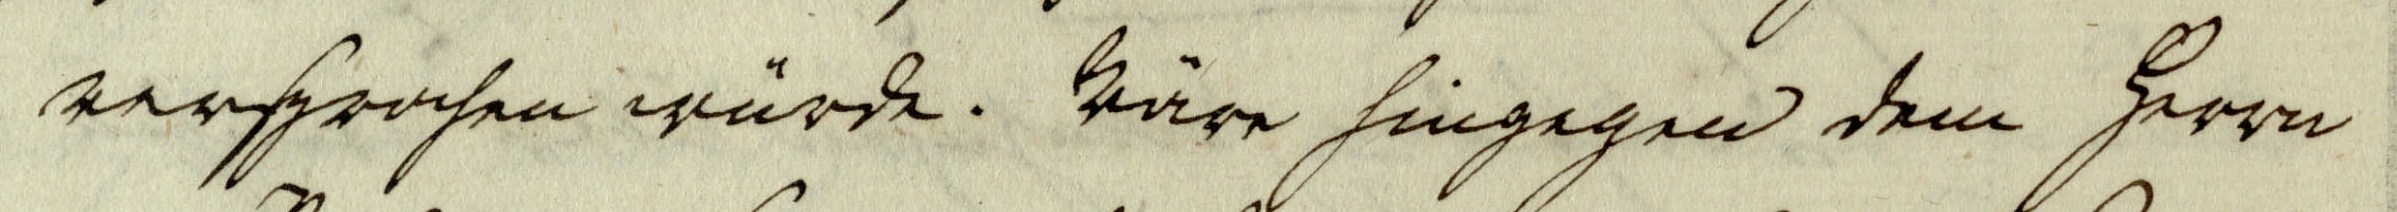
versprochen würde. Wäre hingegen dem Herrn
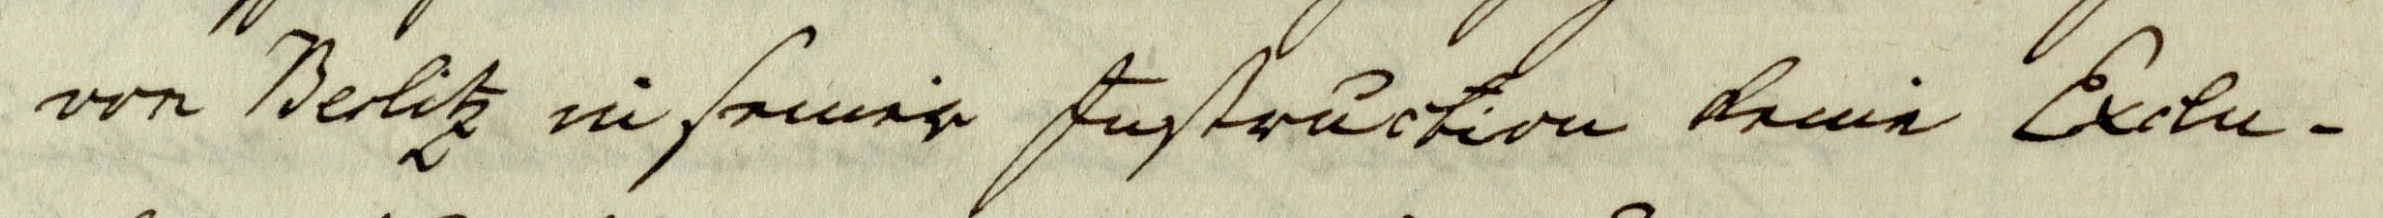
von Berlitz in seiner Instruction keine Exclu¬
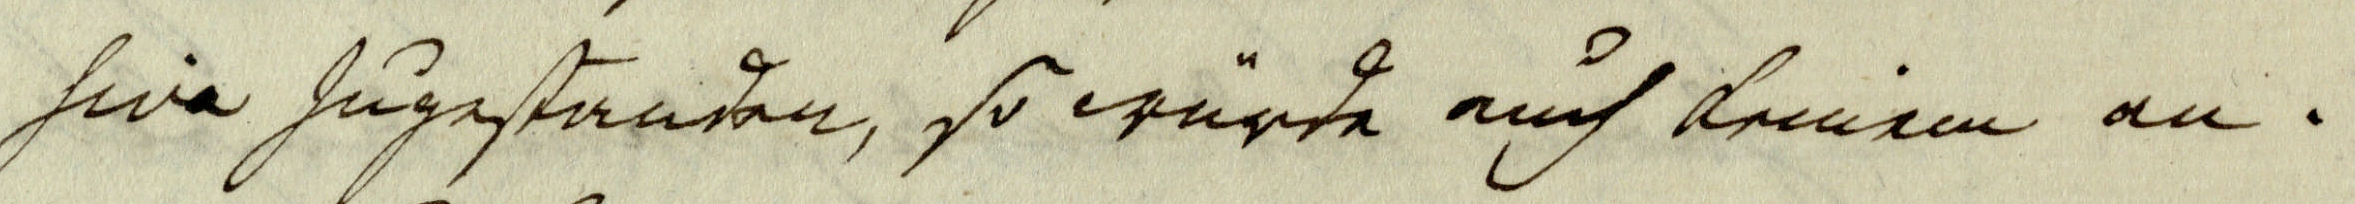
siva zugestanden, so würde auch keinem an¬
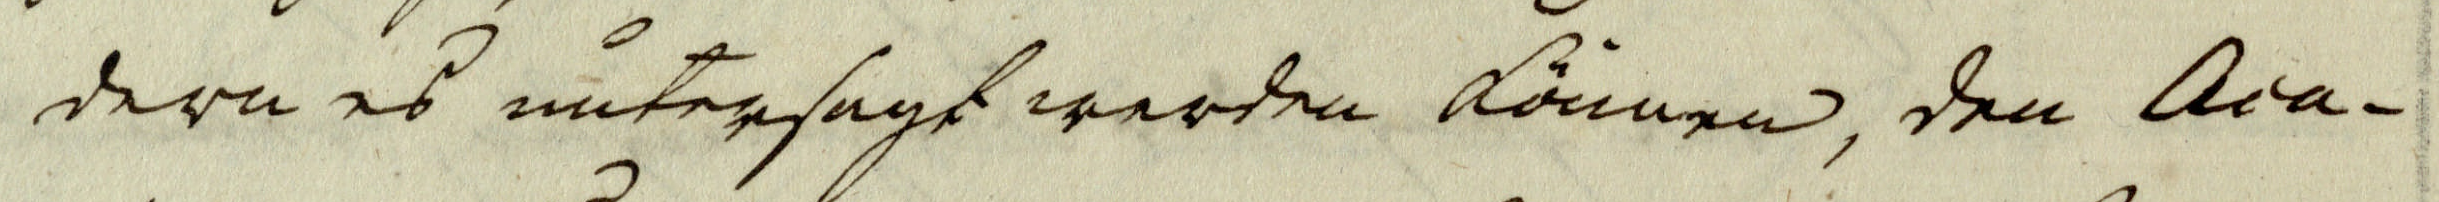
dern es untersagt werden können, den Aca¬
